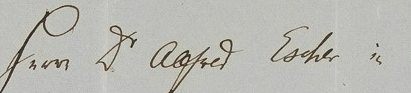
Herr Dr Alfred Escher in
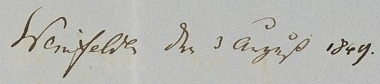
Weinfelden den 3 August 1849.
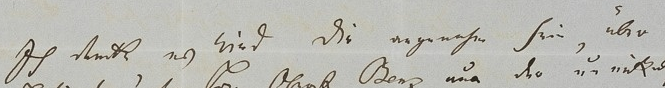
Ich denke es wird Dir angenehm sein, über
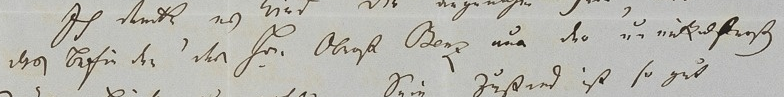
das Befinden des Hr. Oberst Benz aus der unmittelbarsten
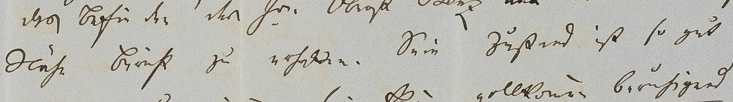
Nähe Bericht zu erhalten. Sein Zustand ist so gut
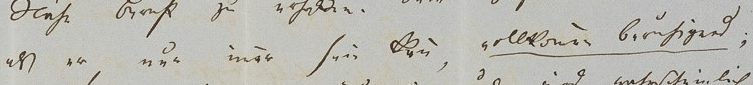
als er nur immer sein kann, vollkommen beruhigend;
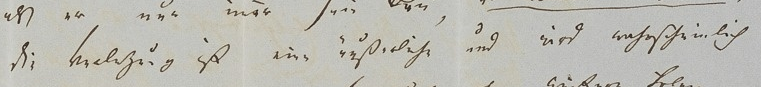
die Verletzung ist eine äußerliche und wird wahrscheinlich
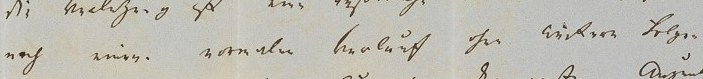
nach einem normalen Verlauf ohne weitere Folgen
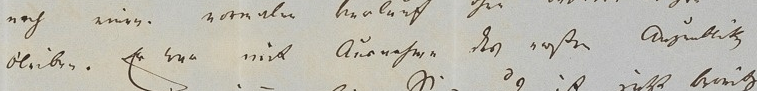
bleiben. Er war mit Ausnahme des ersten Augenbliks
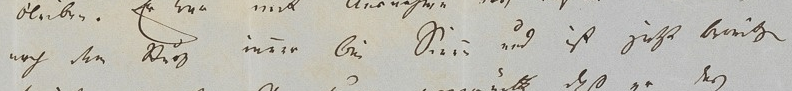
nach dem Sturz immer bei Sinnen und ist jetzt bereits
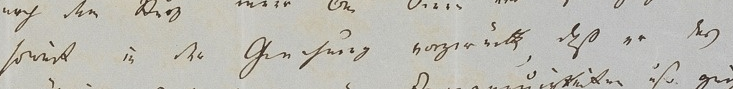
soweit in der Genesung vorgerückt, daß er das
